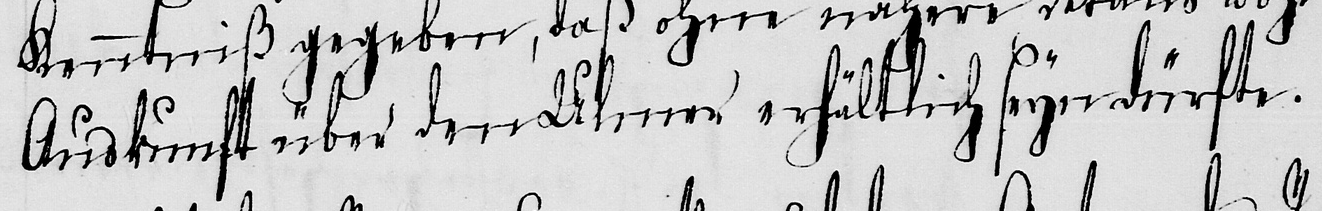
Auskunft über den Ulmer erhältlich seyn dürfte.
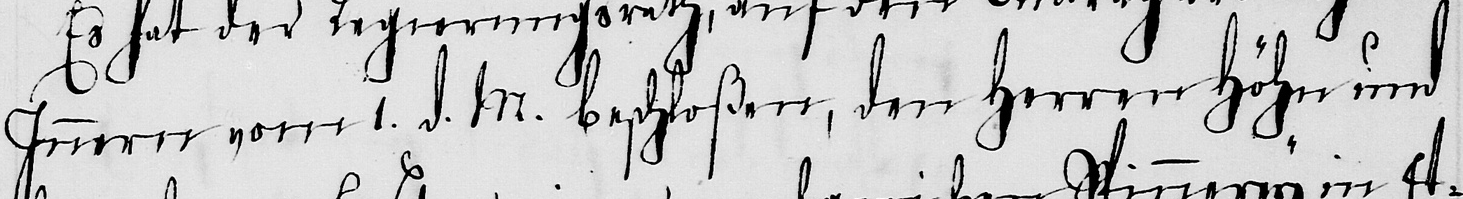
Innern vom 1. d. M. beschloßen, den Herren Höhne und
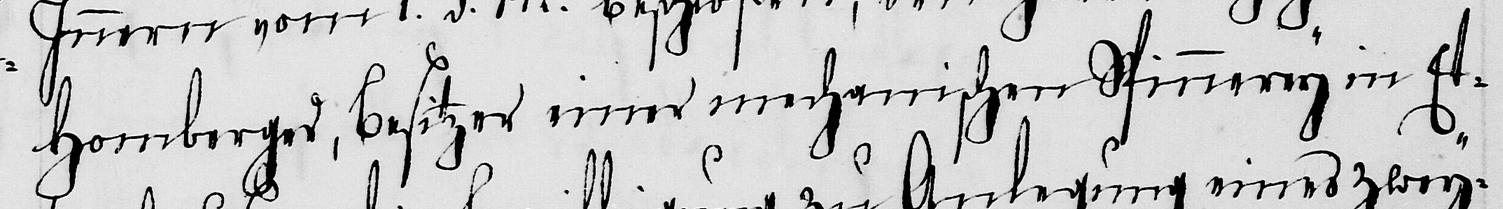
Homberger, Besitzer einer mechanischen Spinnerey in Et¬
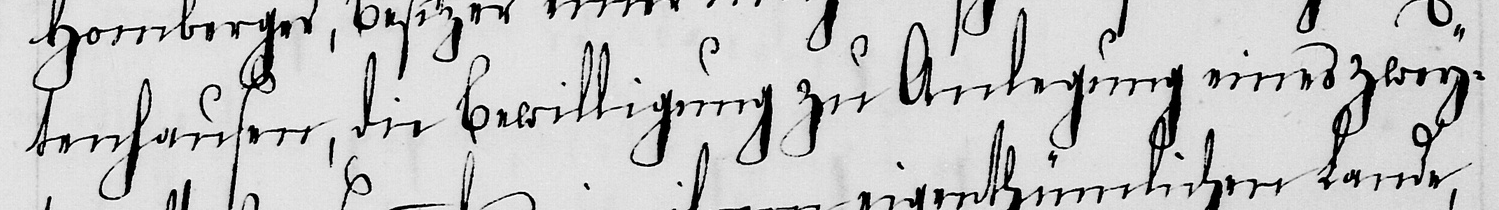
tenhausen, die Bewilligung zu Anlegung eines zwey¬
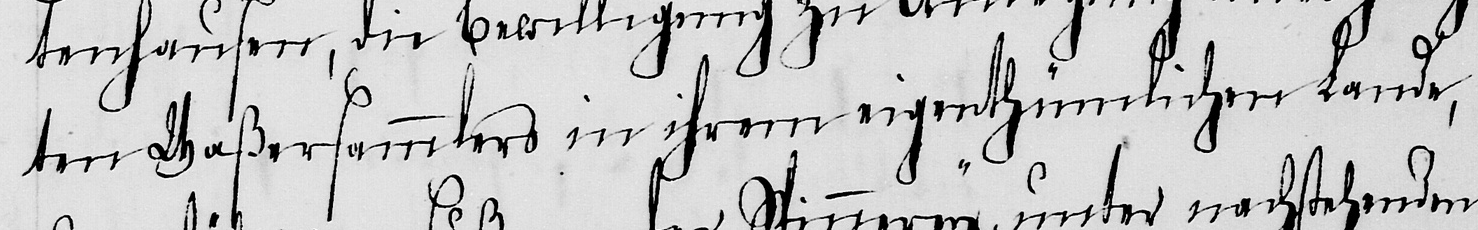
ten Waßersammlers in ihrem eigenthümlichen Lande,
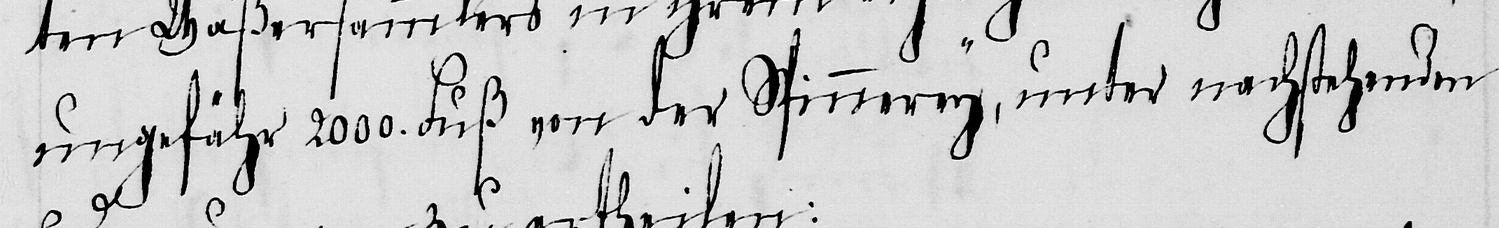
ungefähr 2000. Fuß von der Spinnerey, unter nachstehenden
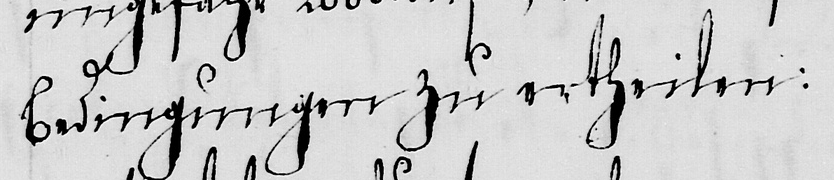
Bedingungen zu ertheilen:
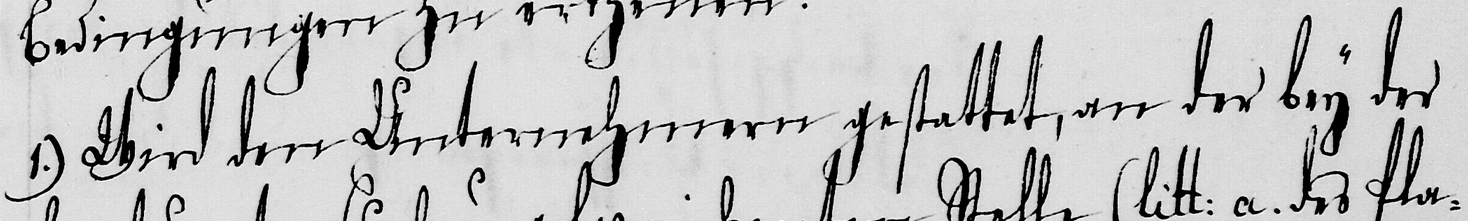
1.) Wird den Unternehmern gestattet, an der bey der
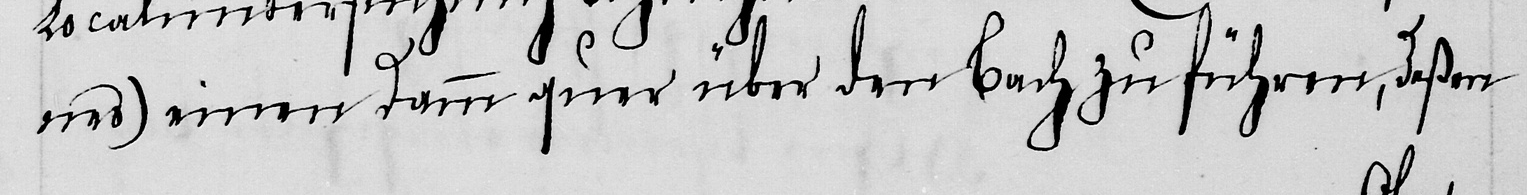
nes) einen Damm quer über den Bach zu führen, deßen
